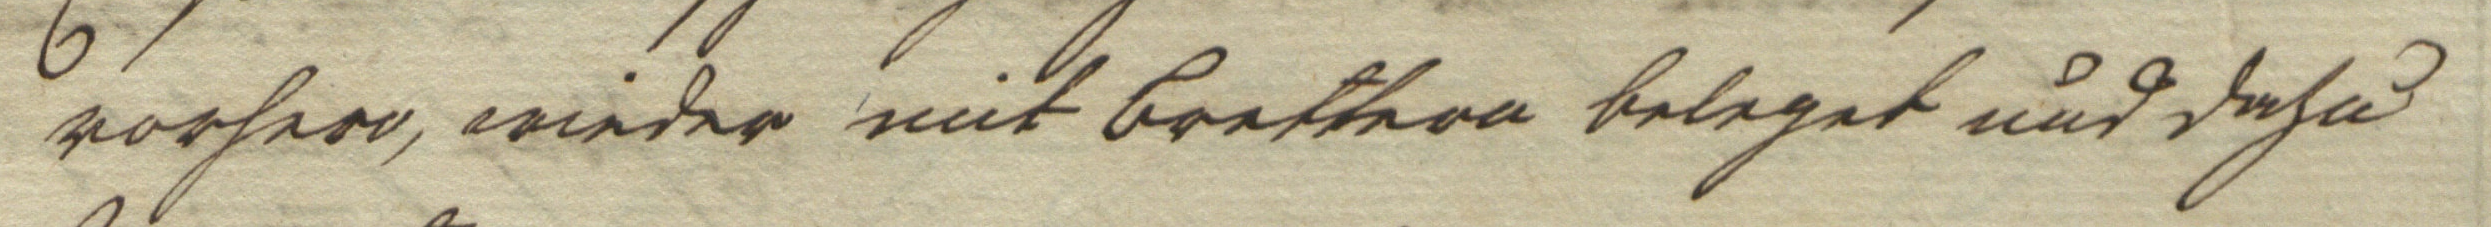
vorhero, wieder mit Brettern beleget und dazu
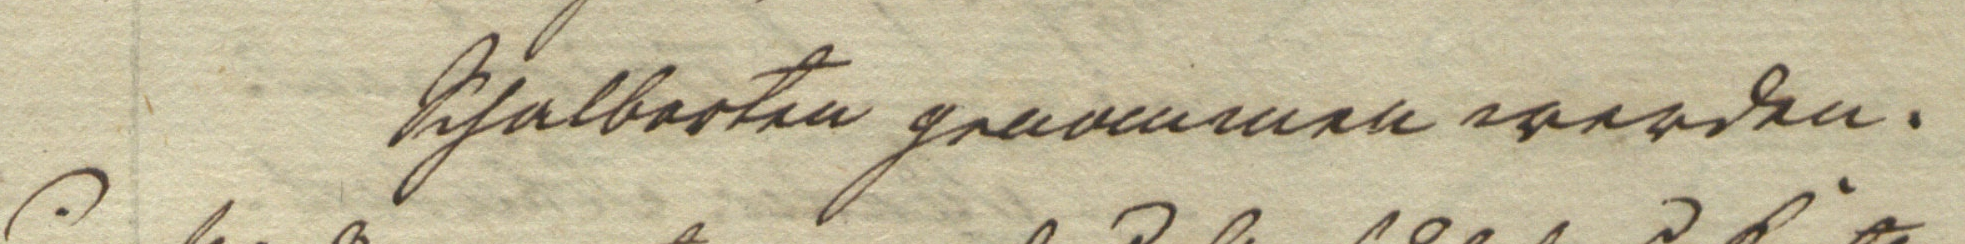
Schalborten genommen werden.
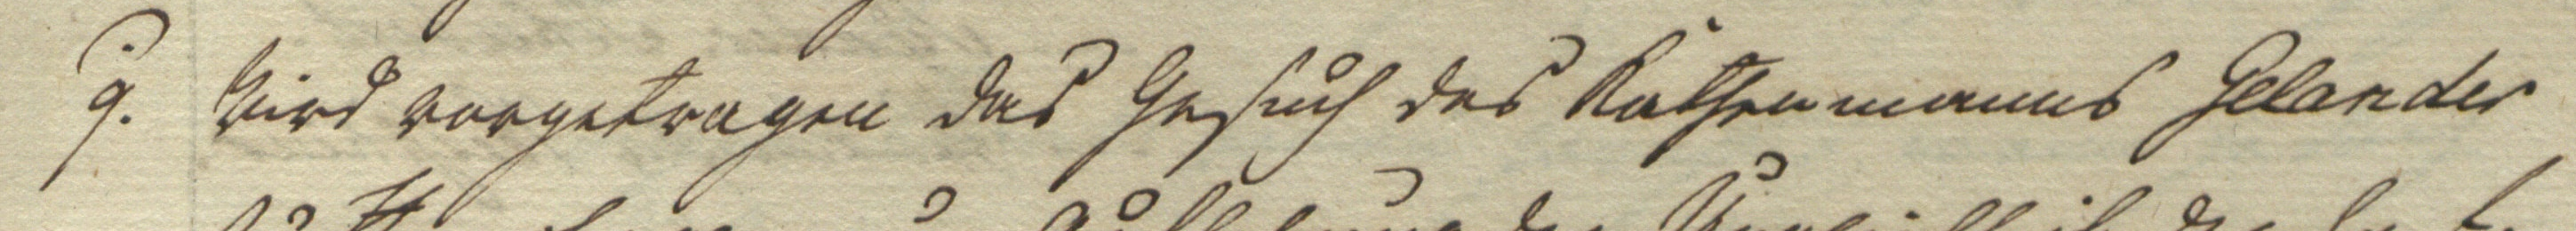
9. Wird vorgetragen das Gesuch des Kathenmanns Gelander
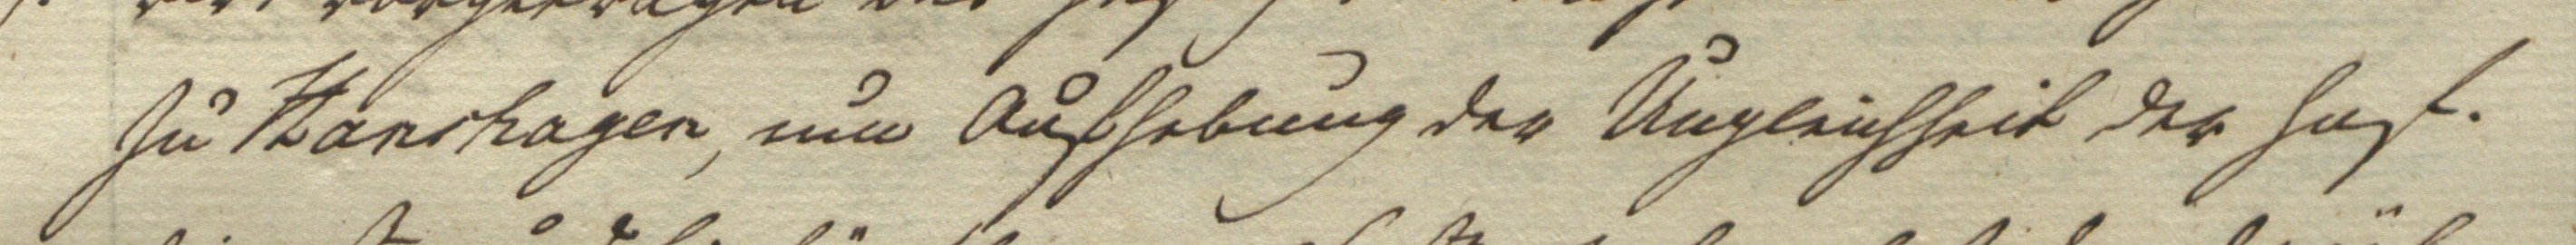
zu Hanshagen, um Aufhebung der Ungleichheit der Hof¬
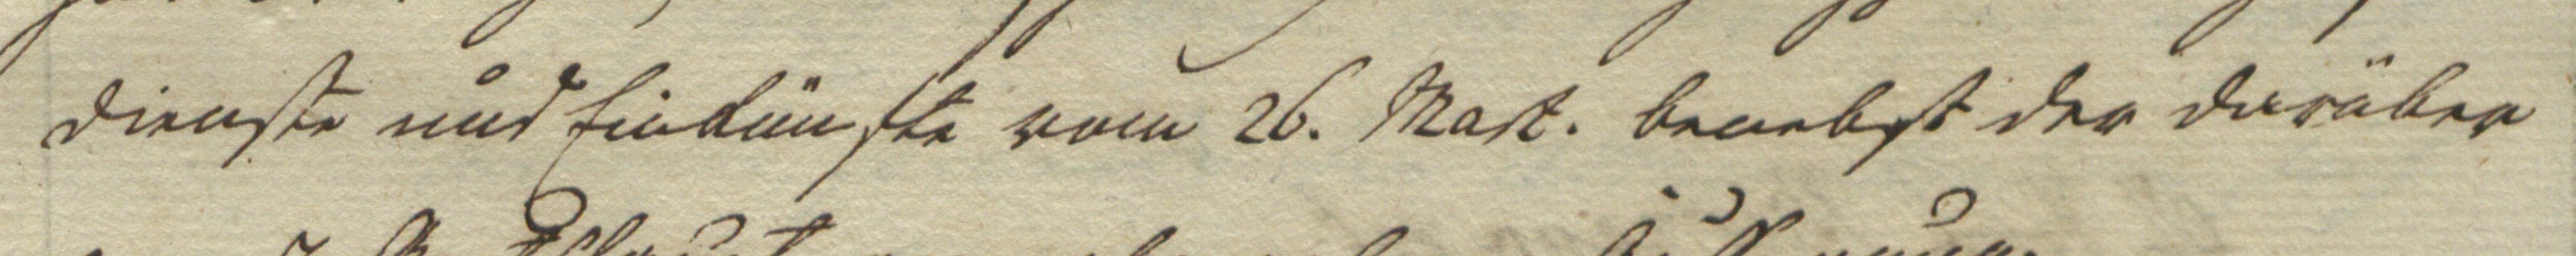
dienste und Einkünfte vom 26. Mart. benebst der darüber
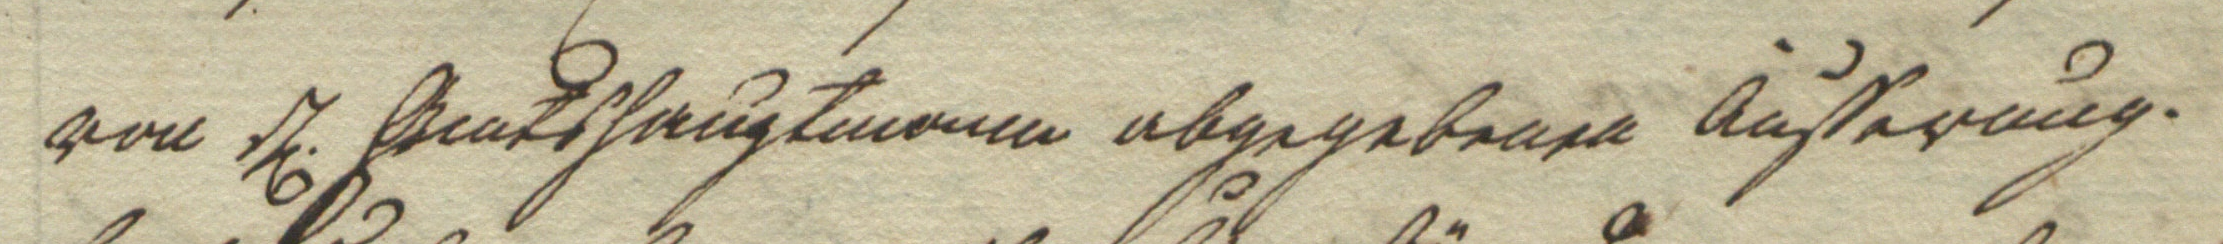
von dh. Amtshauptmann abgegebenen Äusserung.
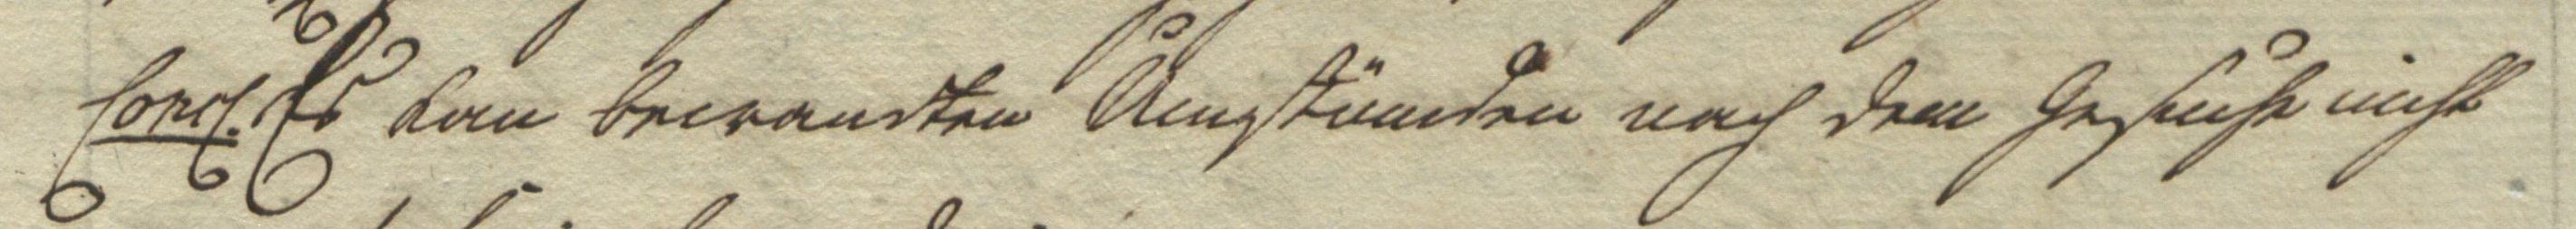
Concl. Es kan bewandten Umständen nach dem Gesuch nicht
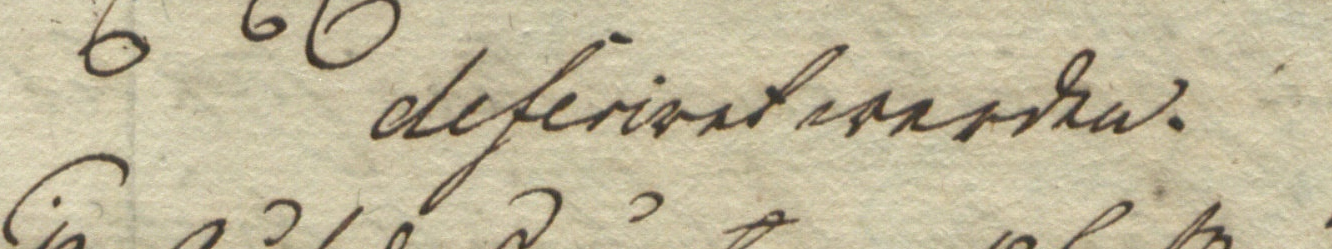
deferiret werden.
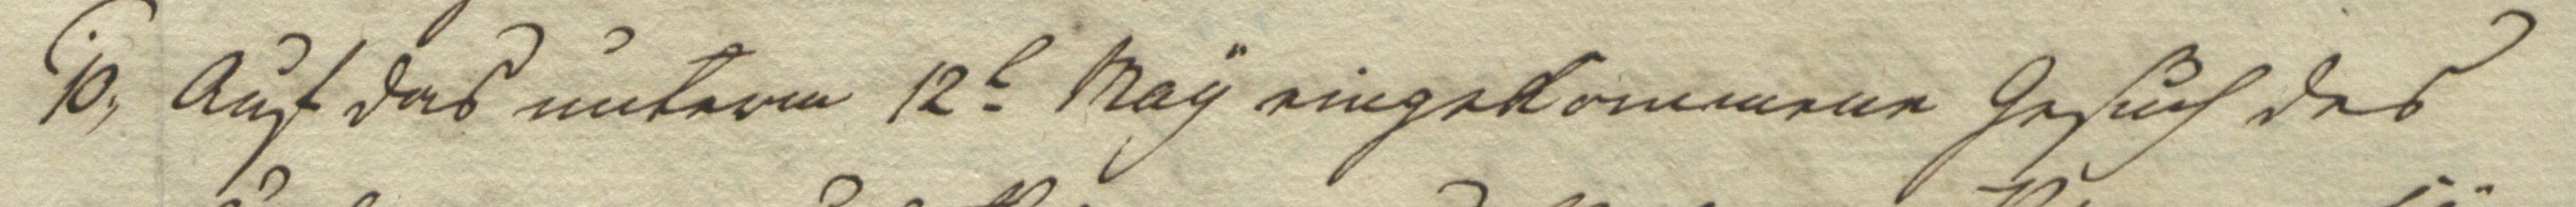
10., Auf das unterm 12t. May eingekommene Gesuch des
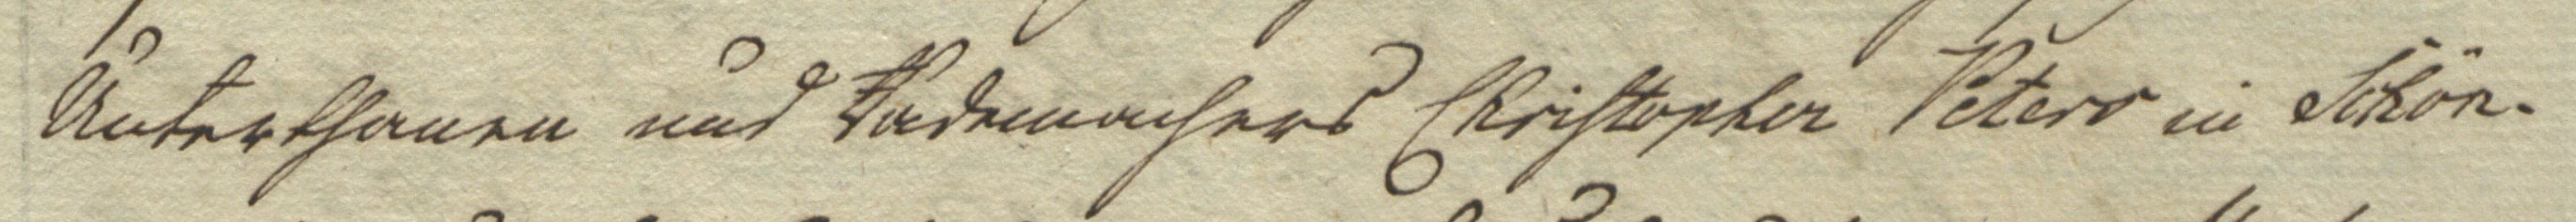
Unterthanen und Rademachers Christopher Peters in Schön¬
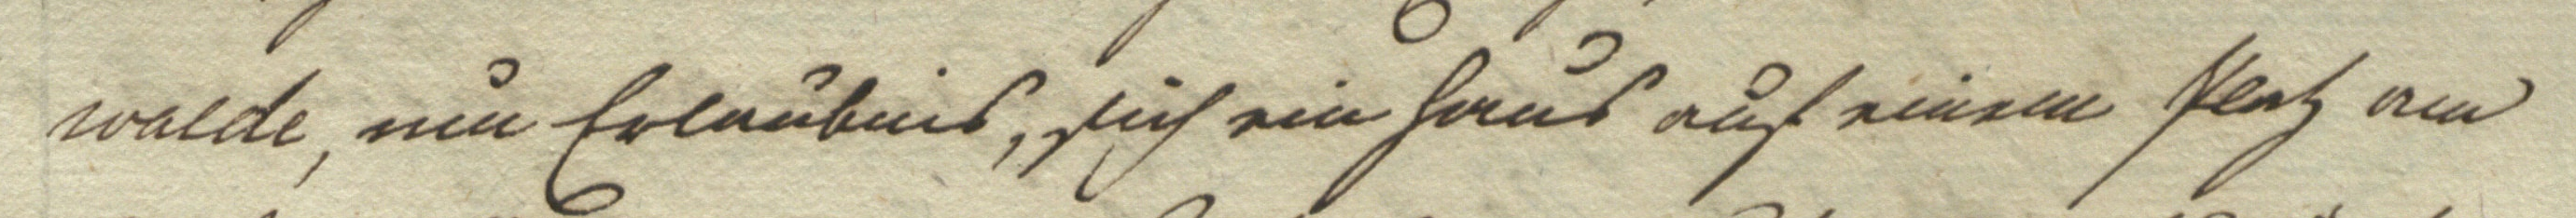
walde, um Erlaubnis, sich ein Haus auf einem Platz am
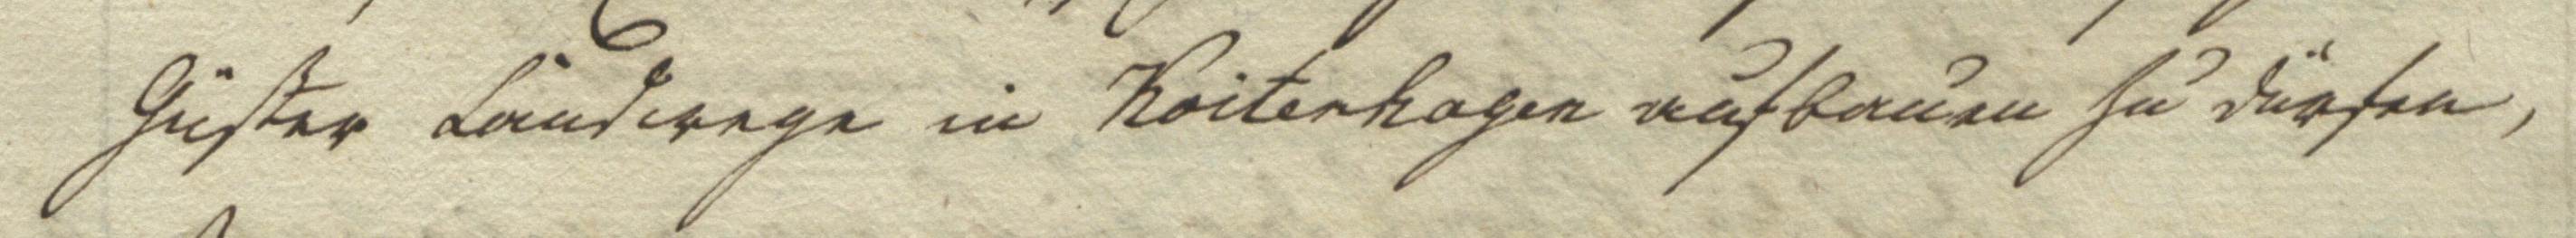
Güster Landwege in Koitenhagen aufbauen zu dürfen,
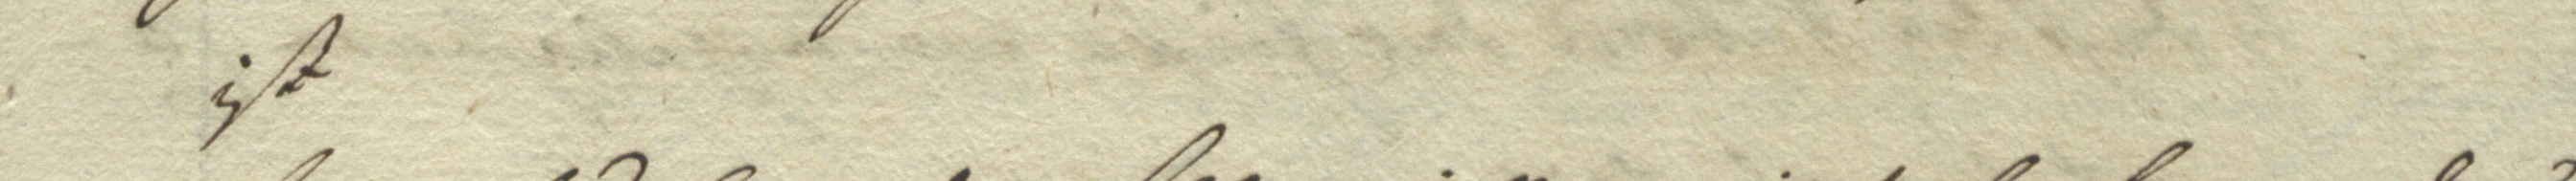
ist
